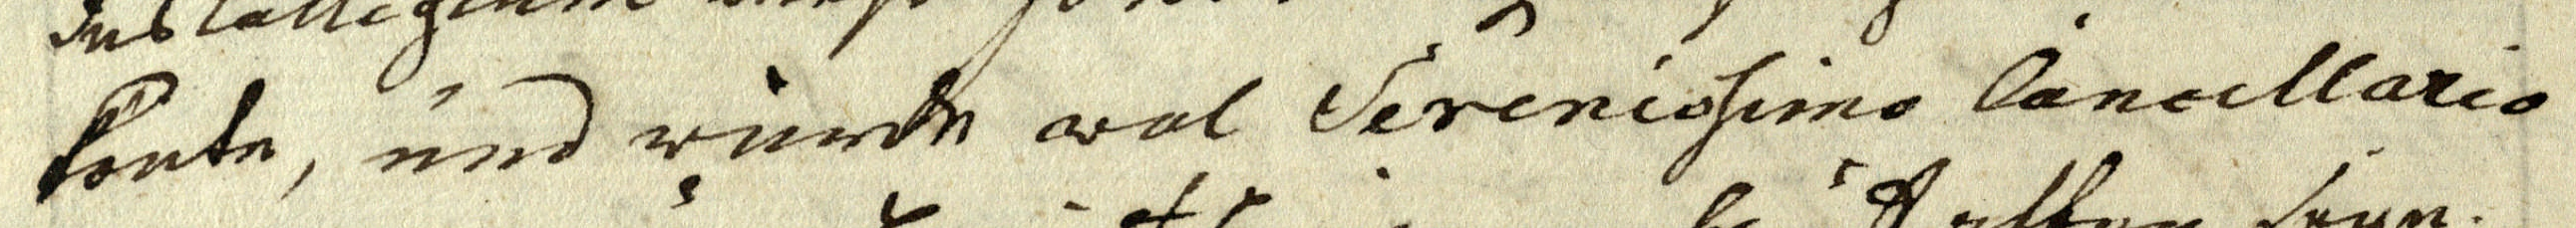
könte, und würde wol Serenissimo Cancellario
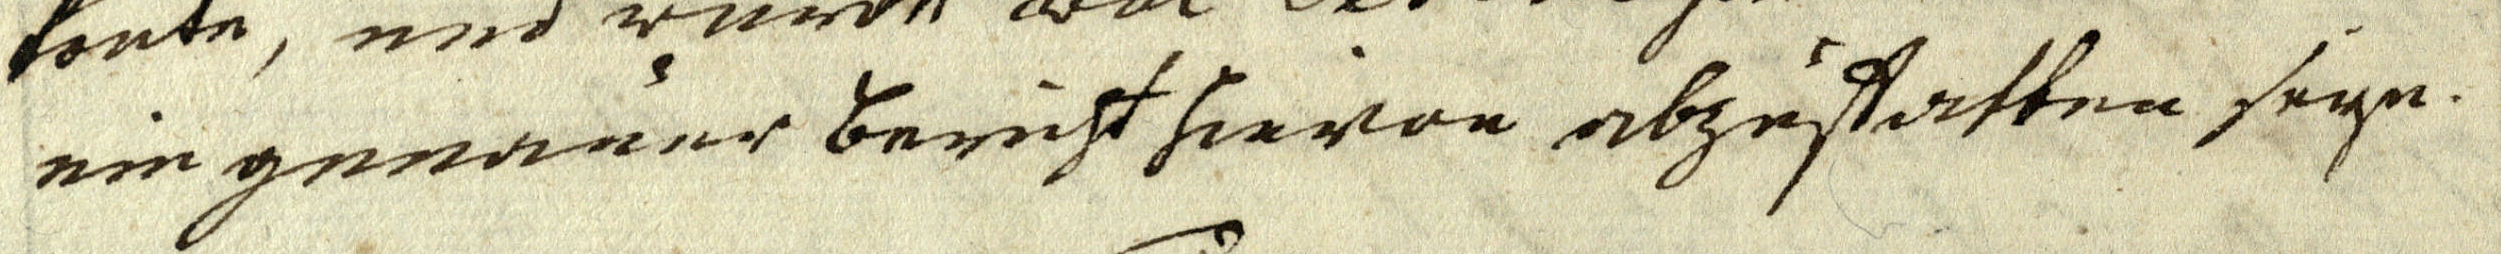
ein genauer Bericht hievon abzustatten seÿn.
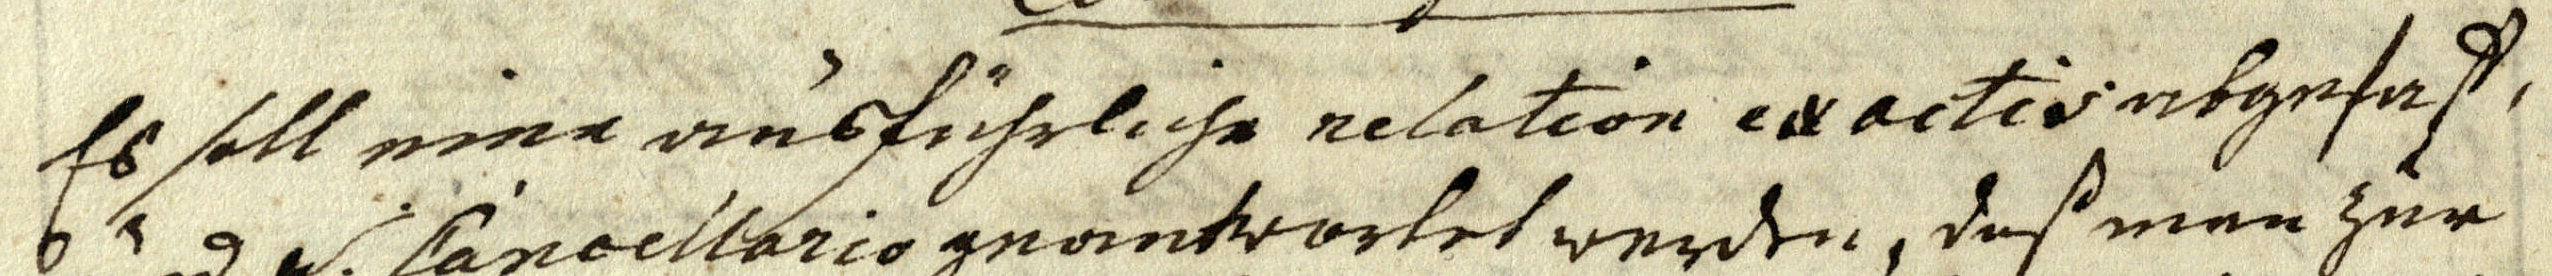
Es soll eine ausführliche relation ex actis abgefast
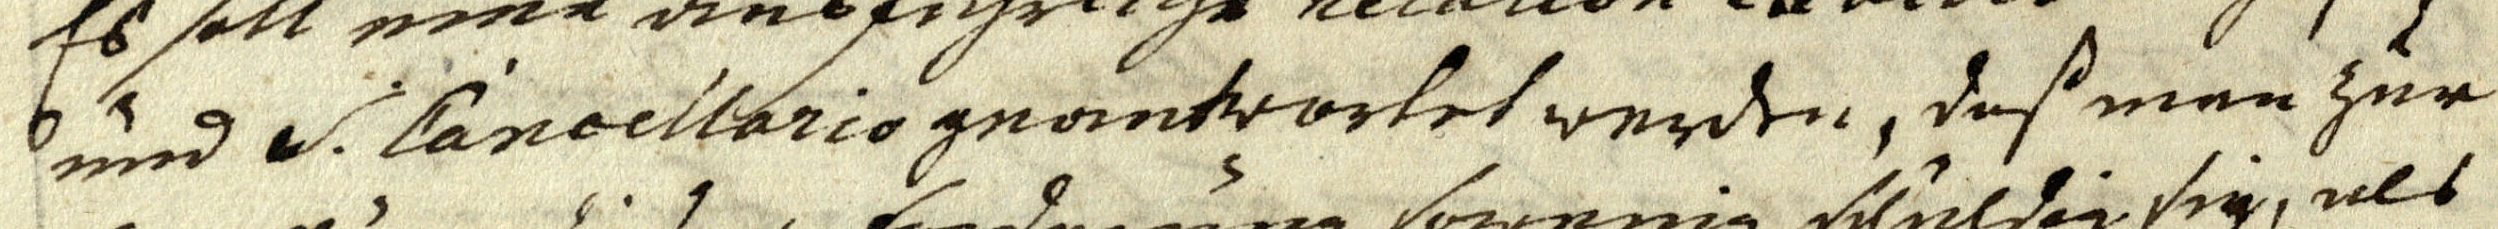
und S. Cancellario geantwortet werden, daß man zur
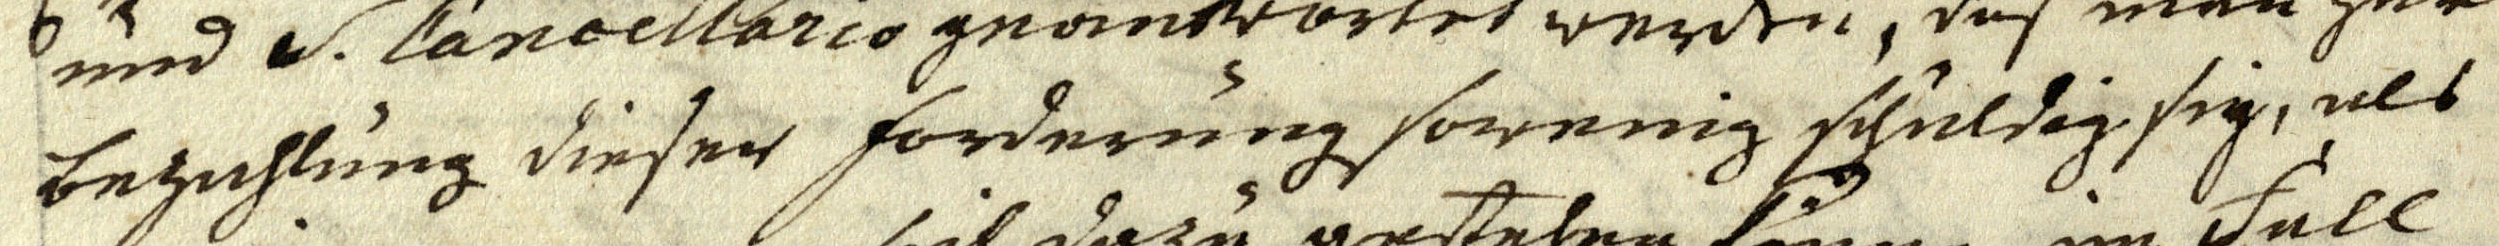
Bezahlung dieser Forderung sowenig schuldig seÿ, als
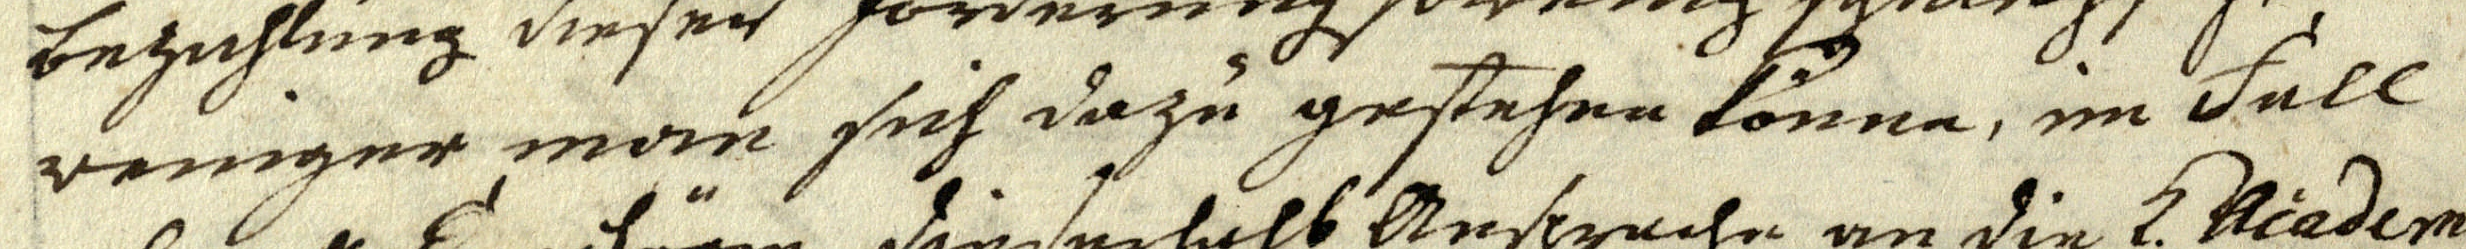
weniger man sich dazu gestehen könne, im Fall
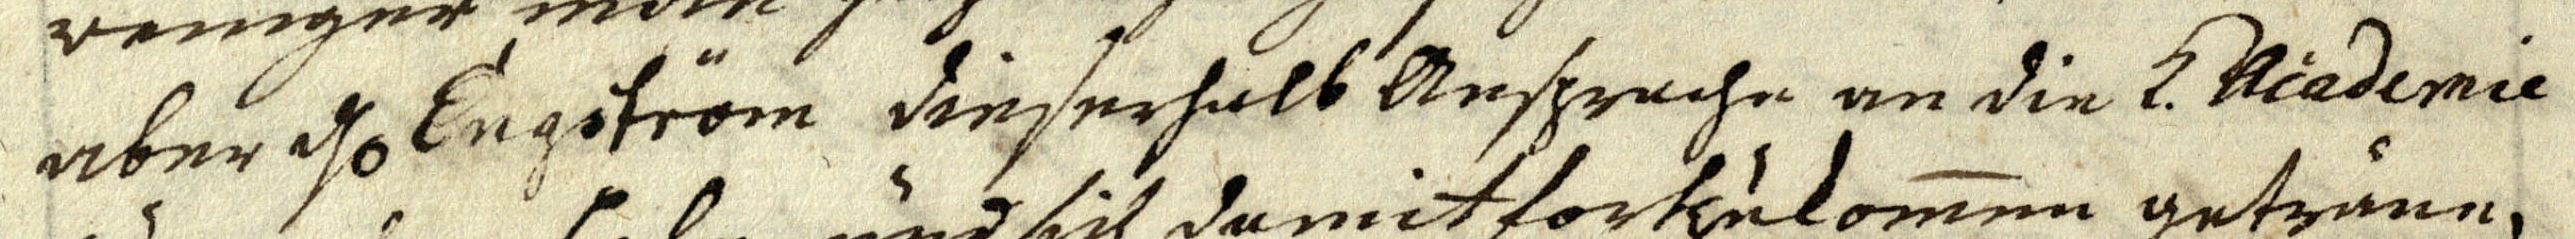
aber dh. Engström dieserhalb Ansprache an die K. Academie
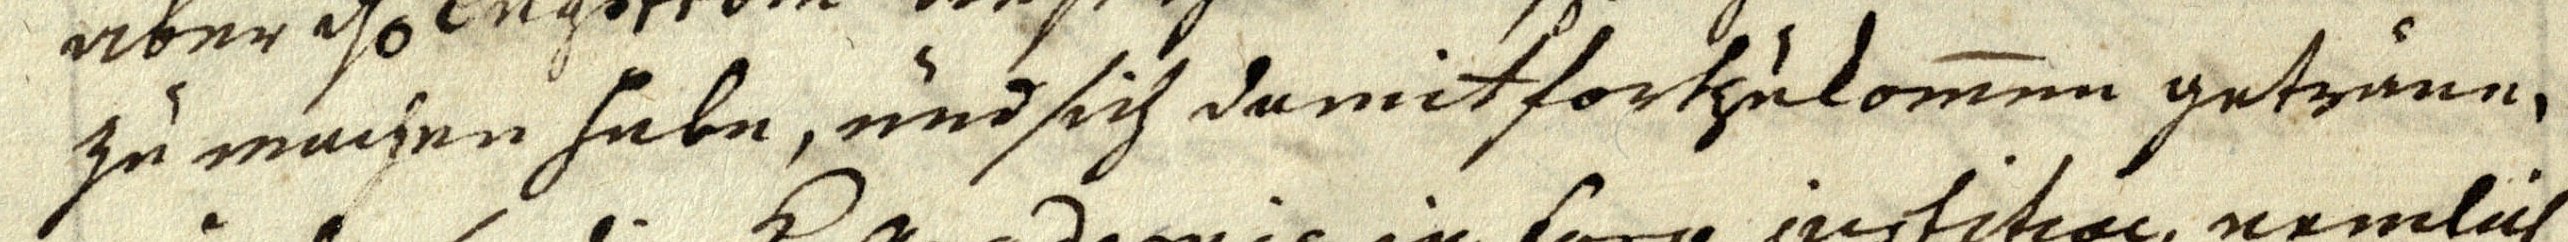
zu machen habe, und sich damit fortzukommen getraue,
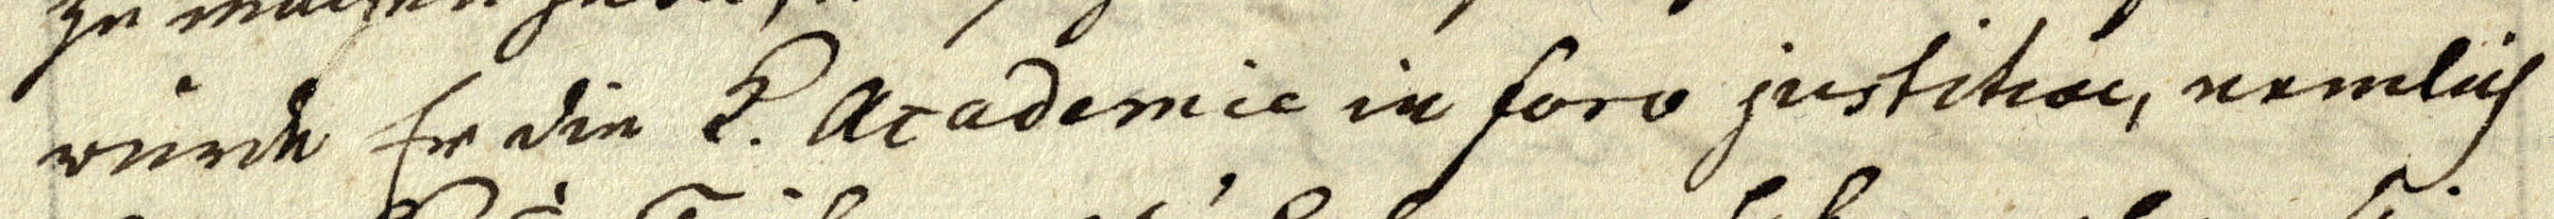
würde Er die K. Academie in foro justitiae, nemlich
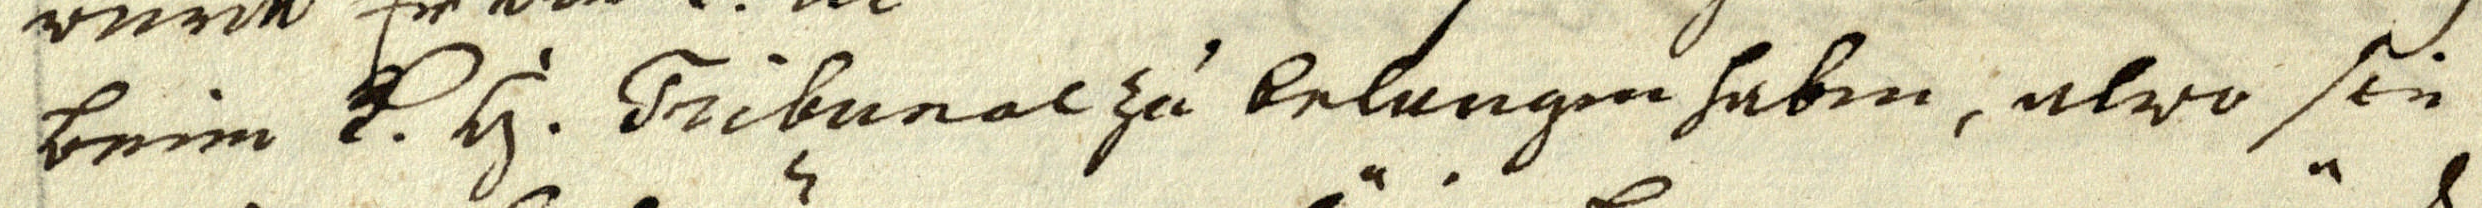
beim K. H. Tribunal zu belangen haben, alwo sie
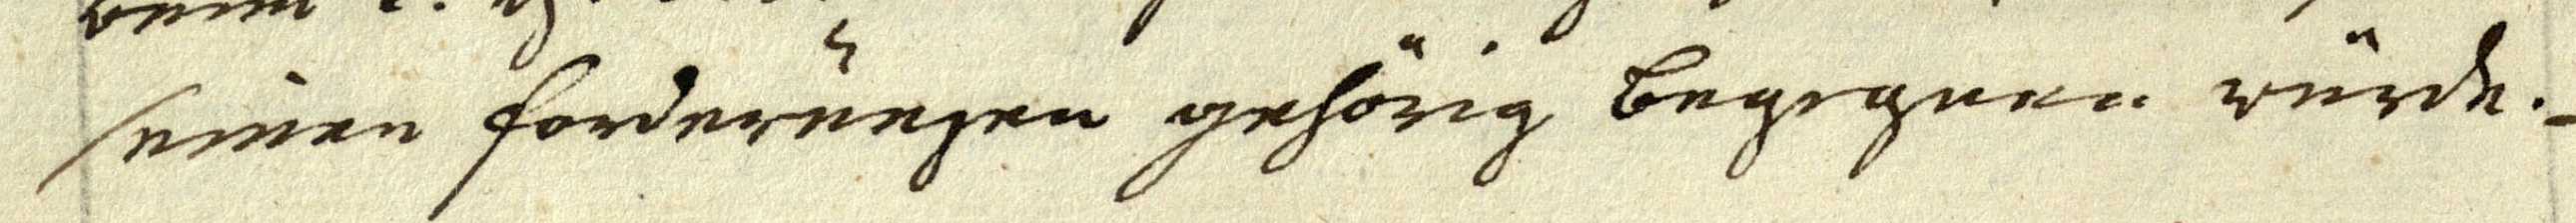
seinen Forderungen gehörig begegnen würde.
